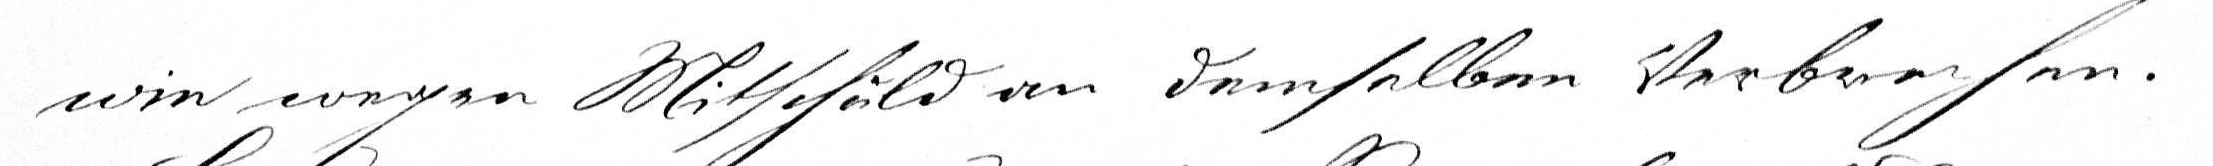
win wegen Mitschuld an demselben Verbrechen.
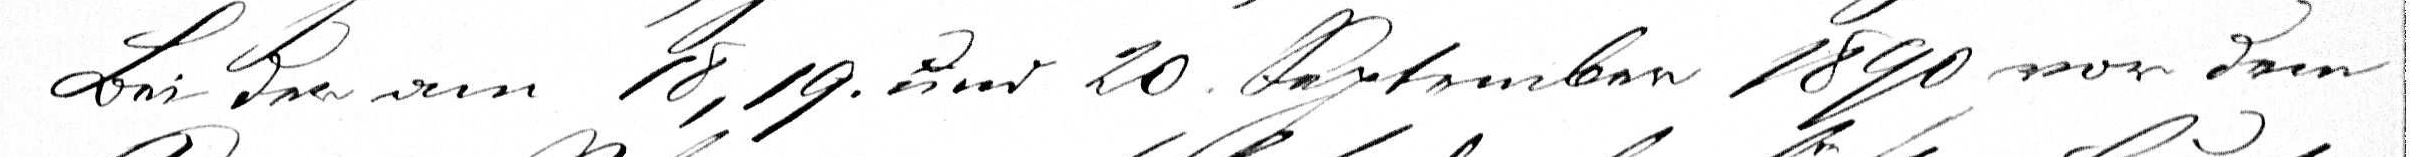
Bei der am 18, 19, und 20 September 1890 vor dem
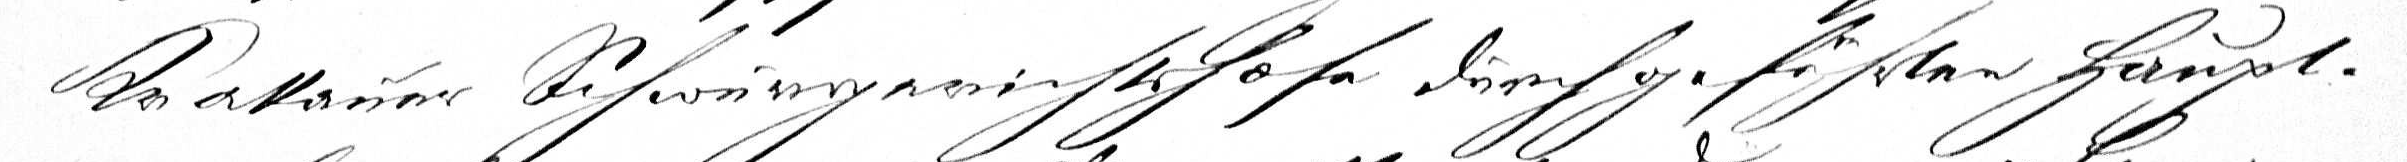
Krakauer Schwurgerichtshofe durchgeführten Haupt¬
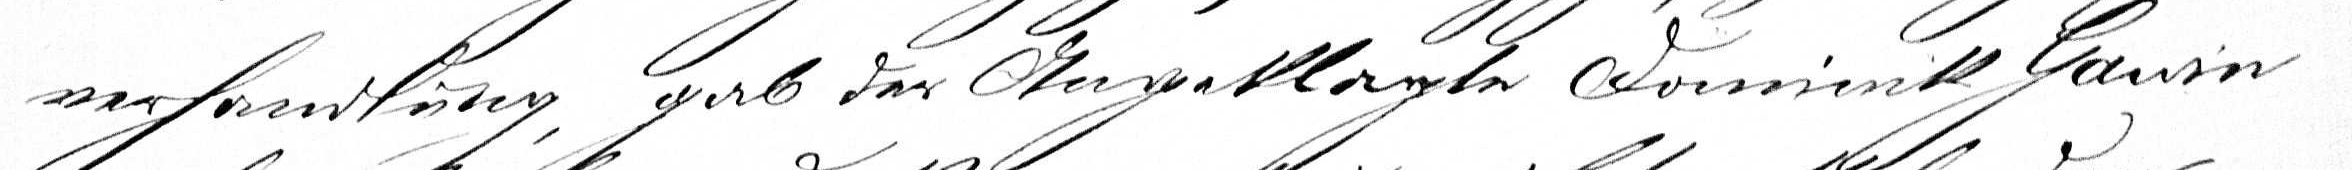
verhandlung, gab der Angeklagte Dominik Gawin
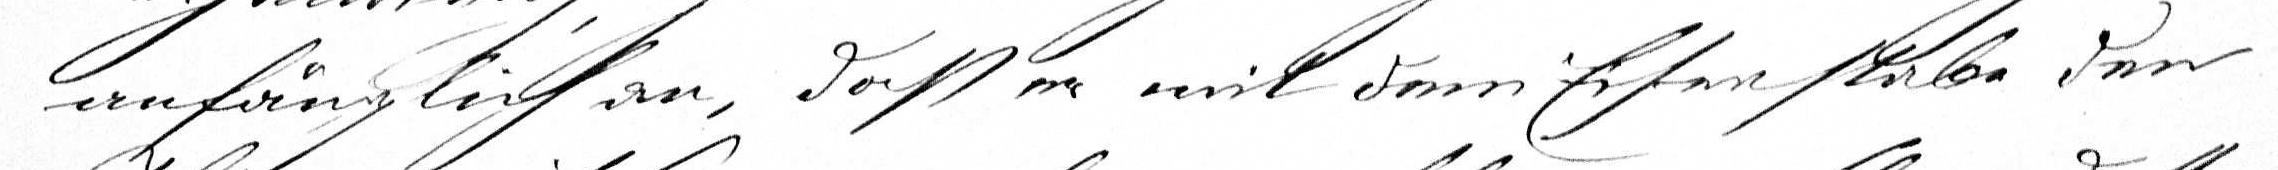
anfänglich an, daß er mit dem Eisenstab den
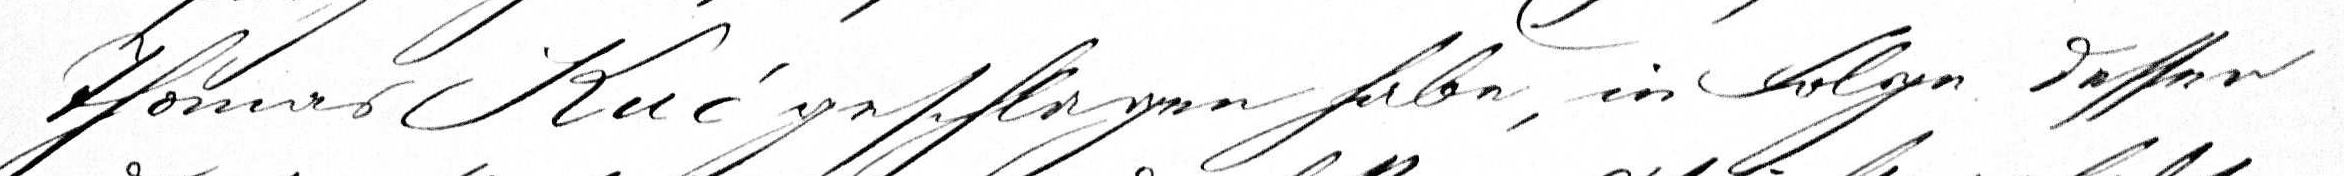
Thomas Kuć geschlagen habe, in Folge dessen
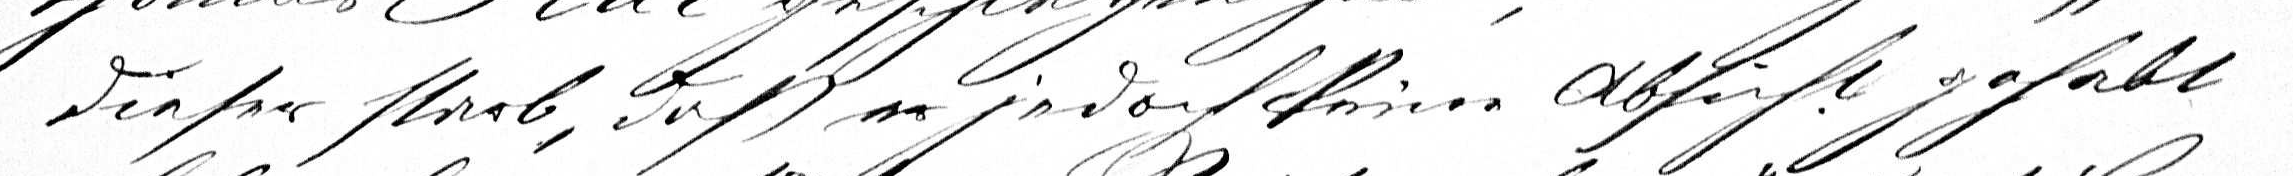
dieser starb, daß er jedoch keinen Absicht gehabt
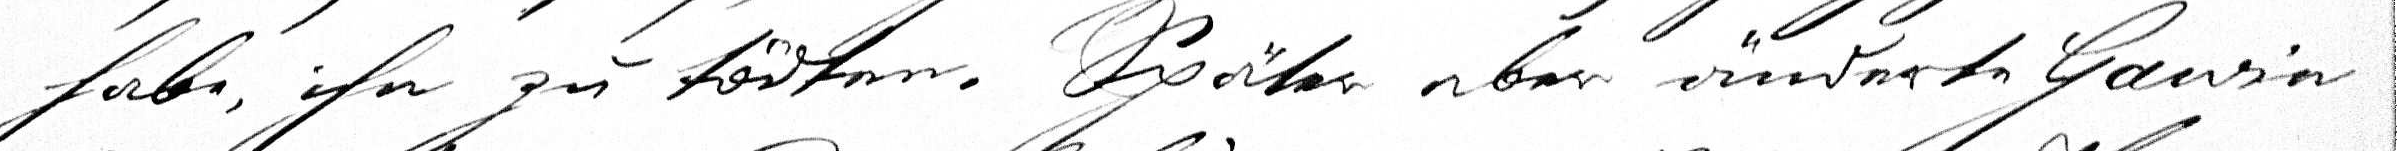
habe, ihn zu tödten. Später aber änderte Gawin
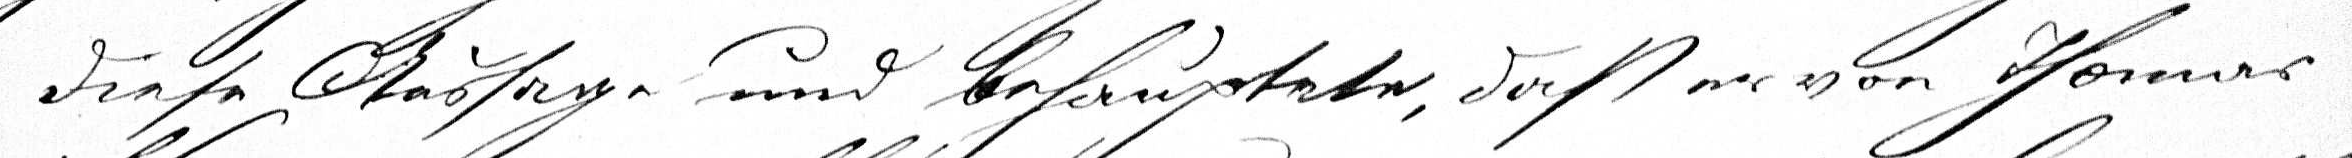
diese Aussage und behauptete, daß er von Thomas
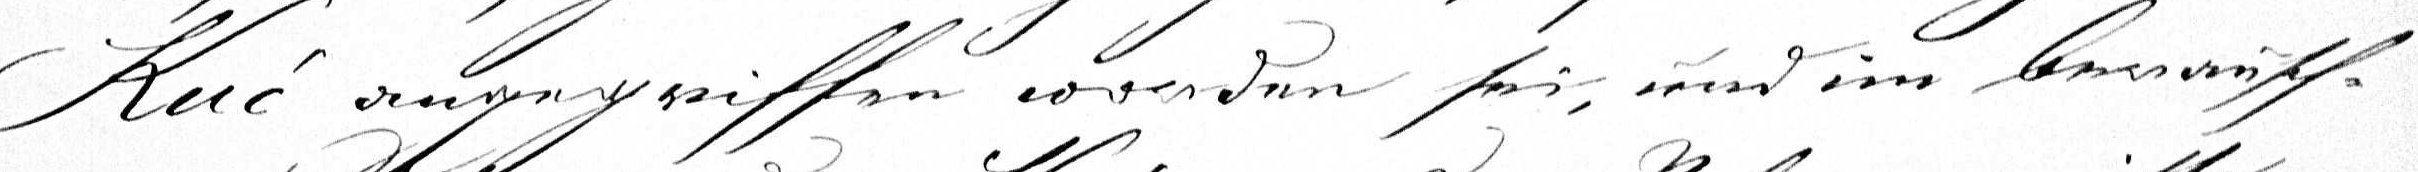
Kuć angegriffen worden sei, und im berausch¬
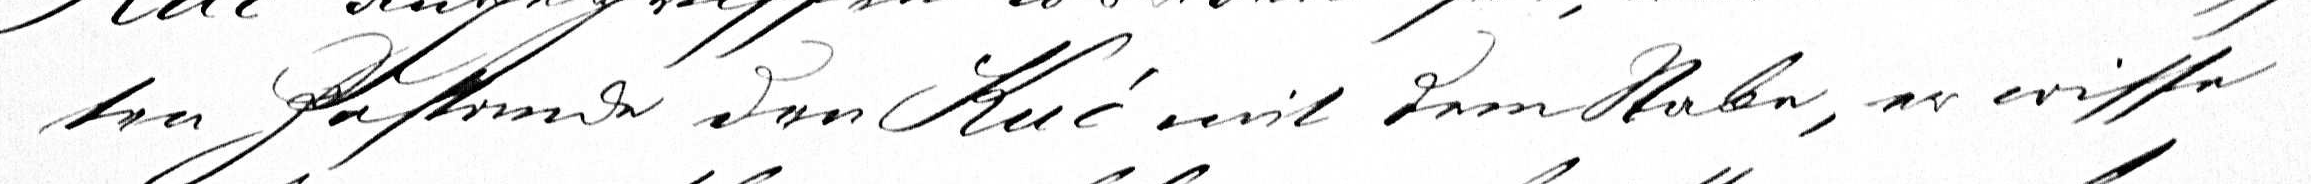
ten Zustande den Kuć mit dem Stabe, er wisse
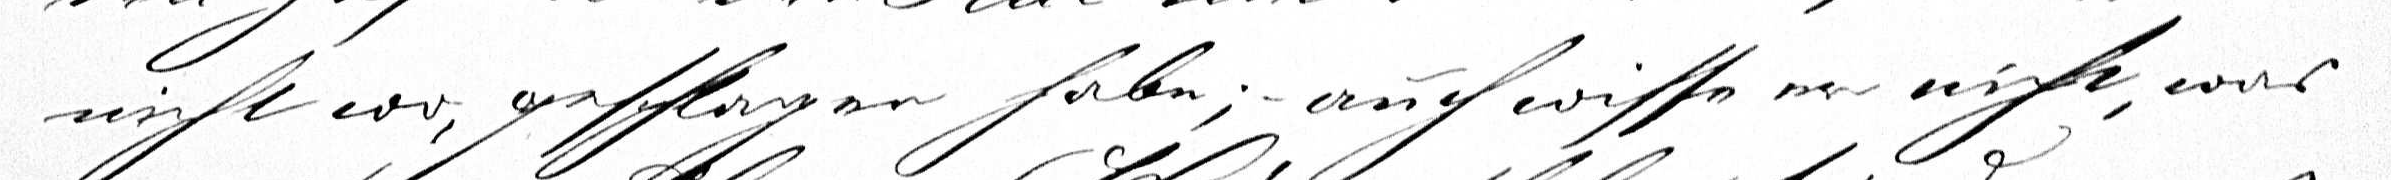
nicht wo, geschlagen habe; auch wisse er nicht, was
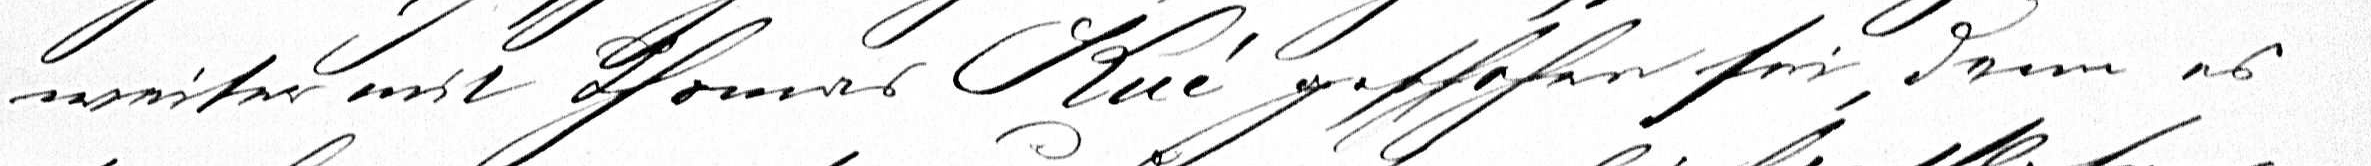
weiter mit Thomas Kuć geschehen sei, denn es
